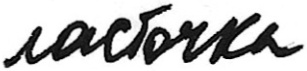ласточка
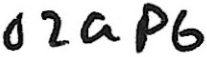огарь
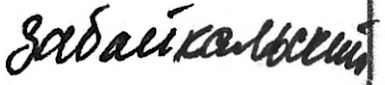забайкальский
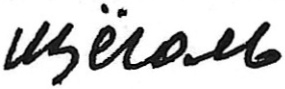щёголь
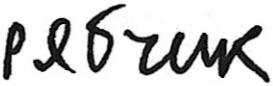рябчик
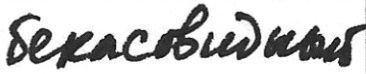бекасовидный
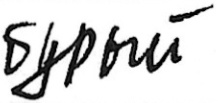бурый
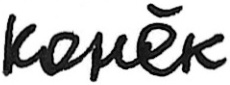конёк
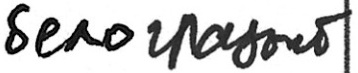белоглазый
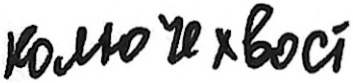колючехвост
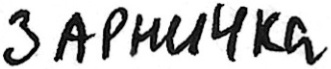зарничка
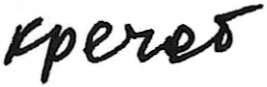кречет
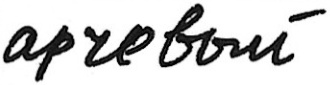арчевый
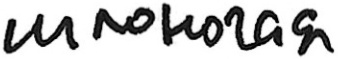иглоногая
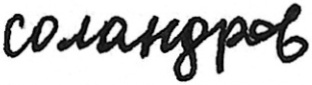соландров
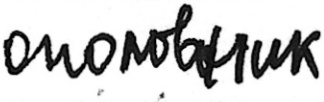ополовник
